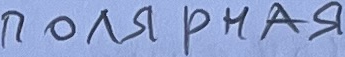полярная
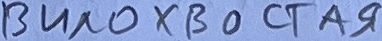вилохвостая
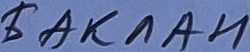баклан
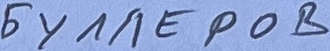буллеров
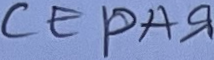серая
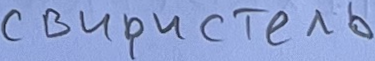свиристель
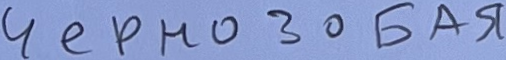чернозобая
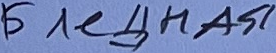бледная
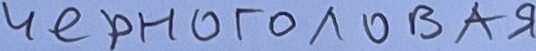черноголовая
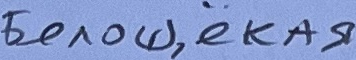белощёкая
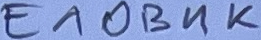еловик
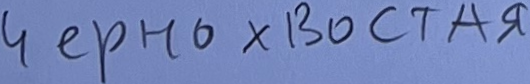чернохвостая
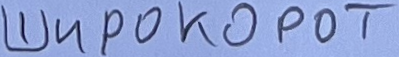широкорот
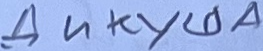дикуша
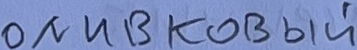оливковый
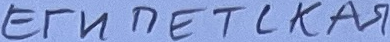египетская
